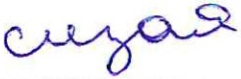сизая
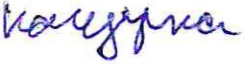качурка
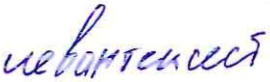левантский
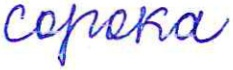сорока
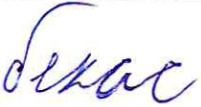бекас
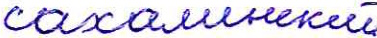сахалинский
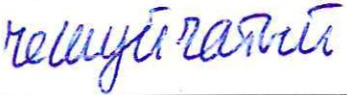чешуйчатый
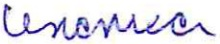ипстка
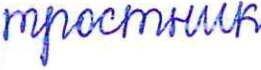тростник
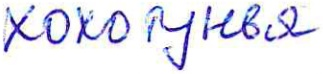хохотунья
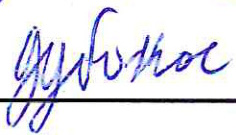дубонос
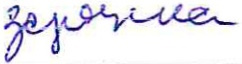зерянка
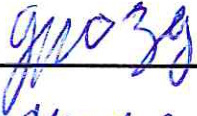дрозд
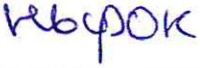нырок
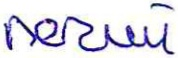пегий
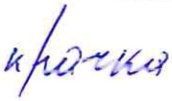крачка
